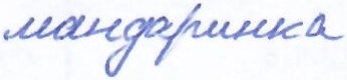мандаринка
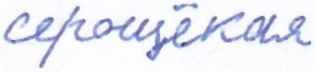серощёкая
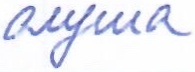олуша
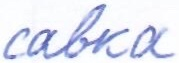савка
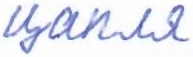цапля
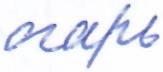огарь
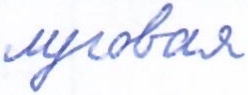луговая
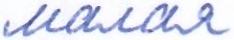малая
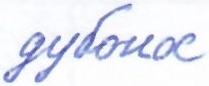дубонос
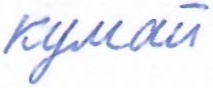кумай
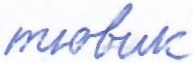тювик
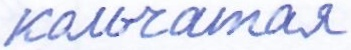кольчатая
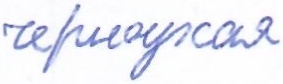черноухая
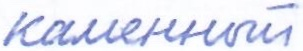каменный
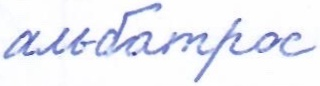альбатрос
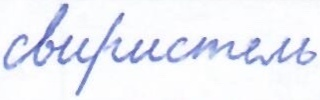свиристель
